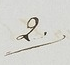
2.
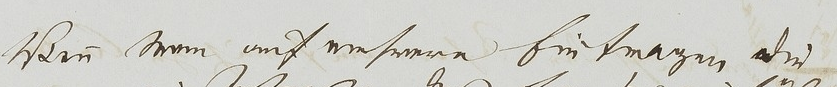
Wenn man auf mehrere Einfragen die
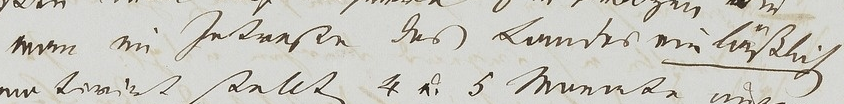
man im Intresse des Landes einläßlich
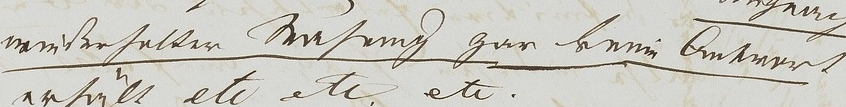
wiederholter Mahnung gar keine Antwort
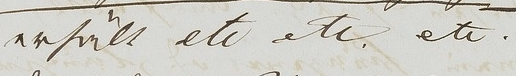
erhält etc etc. etc.
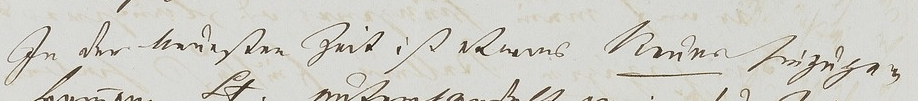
In der neuesten Zeit ist etwas Neues hinzuge-
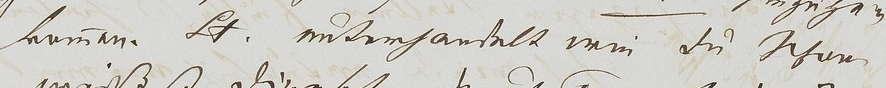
kommen. St. unterhandelt wie du schon
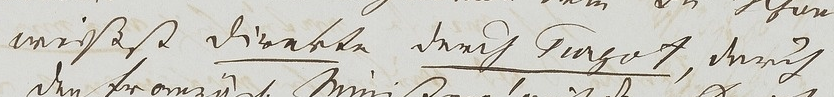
weißst direkte durch Turgot, durch
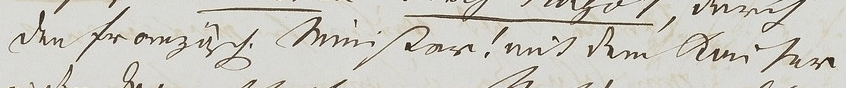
den französch. Minister! mit dem Kaiser
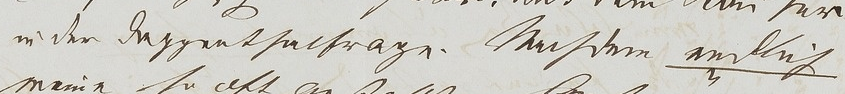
in der Dappenthalfrage. Nachdem endlich
